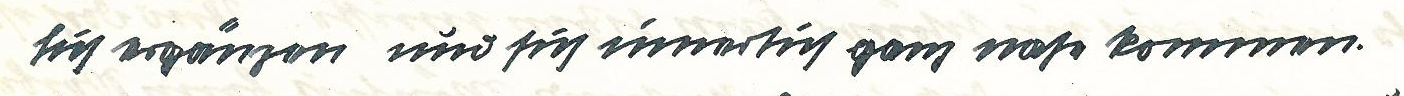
lich ergänzen und sich innerlich ganz nahe kommen.
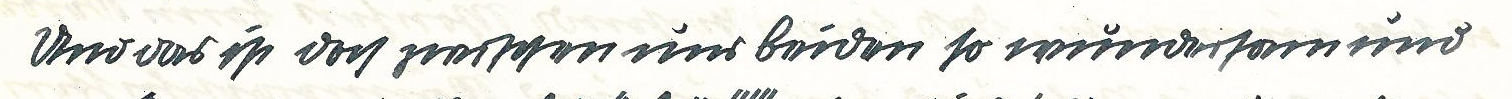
Und das ist doch zwischen uns beiden so wundersam und
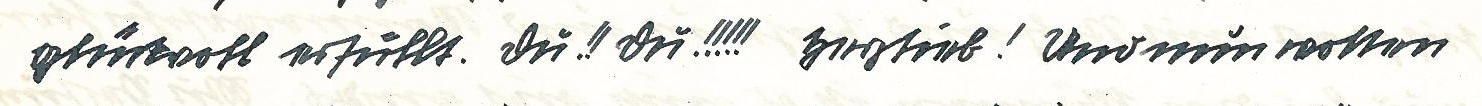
glückvoll erfüllt. Du!! Du!!!!! Herzlieb! Und nun wollen
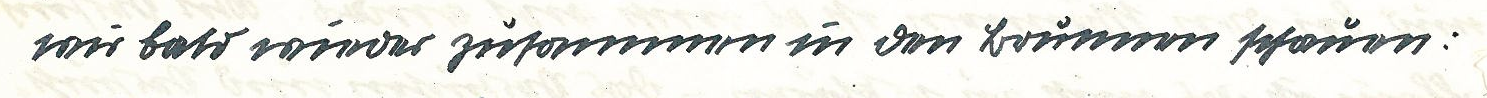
wir bald wieder zusammen in den Brunnen schauen:
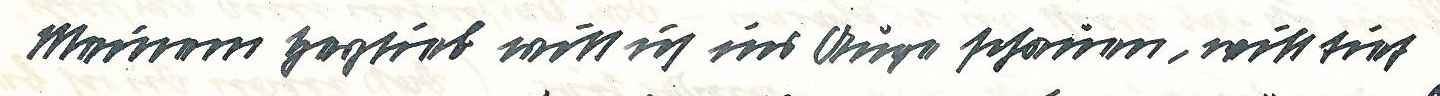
Meinem Herzlieb will ich ins Auge schauen, will tief
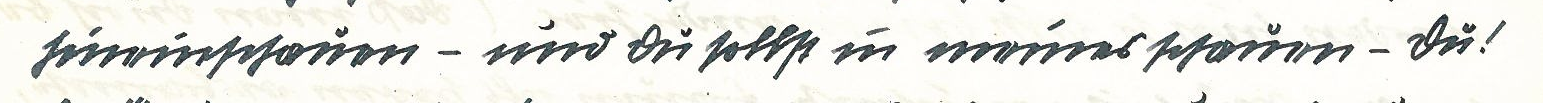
hineinschauen – und Du sollst in meines schauen – Du!
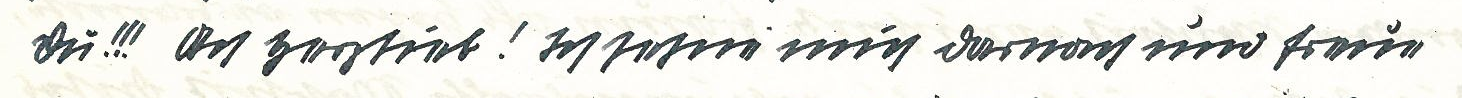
Du!!! Ach Herzlieb! Ich sehne mich darnach und freue
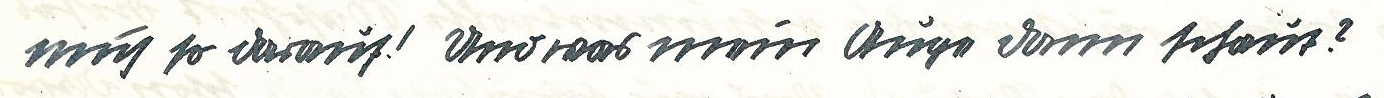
mich so darauf! Und was mein Auge dann schaut?
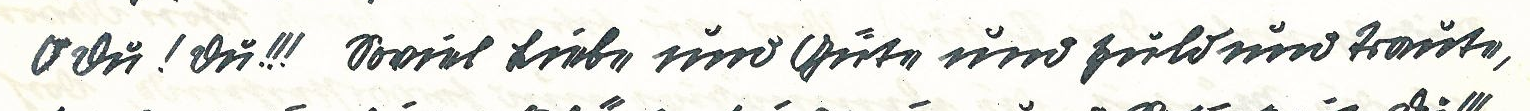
O Du! Du!!! Soviel Liebe und Güte und Huld und Traute,
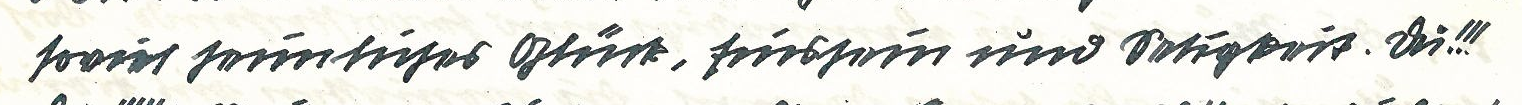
so viel heimliches Glück, Einssein und Seligkeit. Du!!!
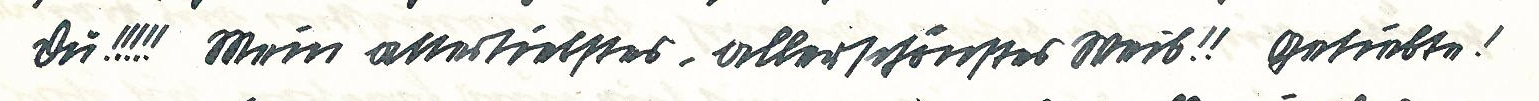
Du!!!!! Mein allerliebstes, allerliebstes Weib!! Geliebte!
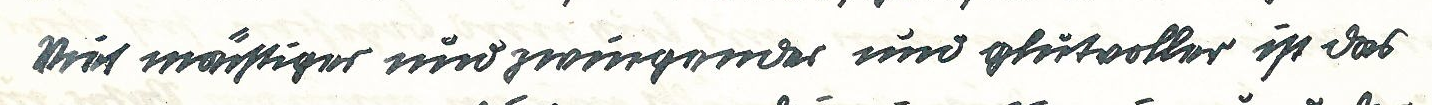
Viel mächtiger und zwingender und glutvoller ist das
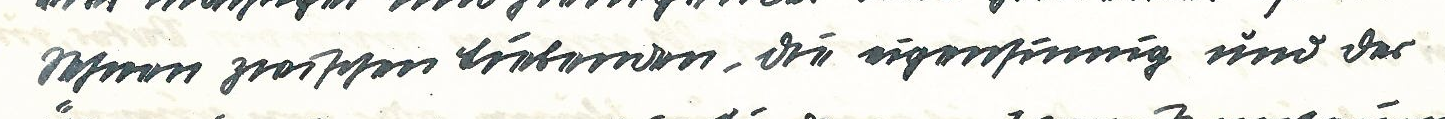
Sehnen zwischen Liebenden, die eigensinnig und der
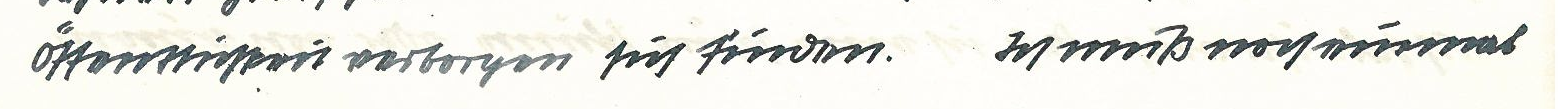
Öffentlichkeit verborgen sich finden. Ich muss noch einmal
